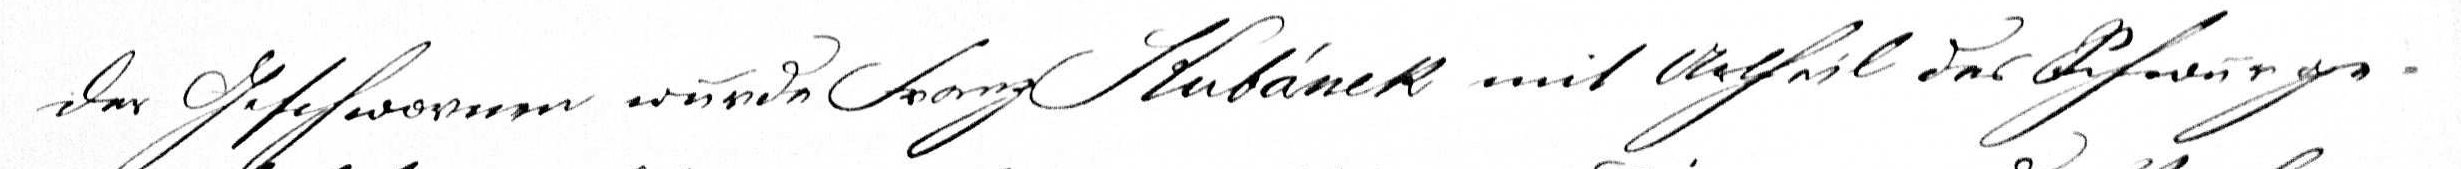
der Geschwornen wurde Franz Kubánek mit Urtheil des Schwurge¬
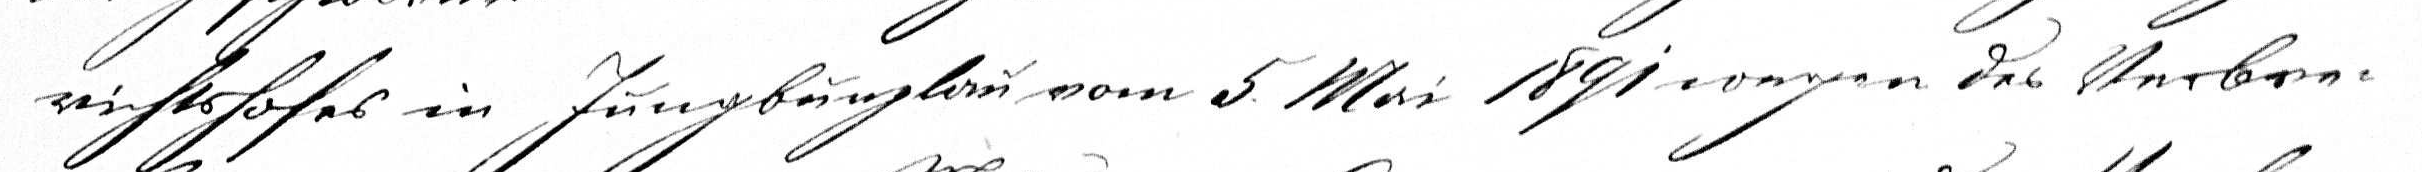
richtshofes in Jungbungzlau vom 5. Mai 1891 wegen des Verbre¬
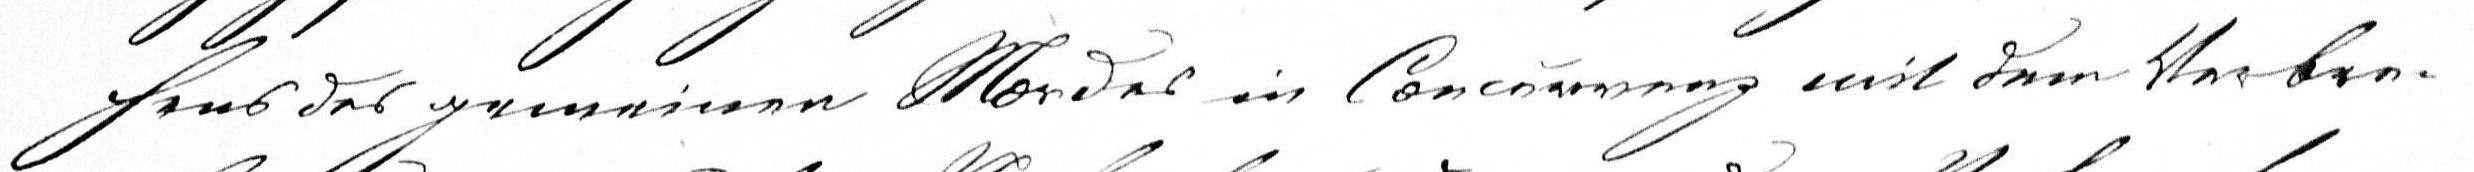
chens des gemeinen Mordes in Concurrenz mit dem Verbre¬
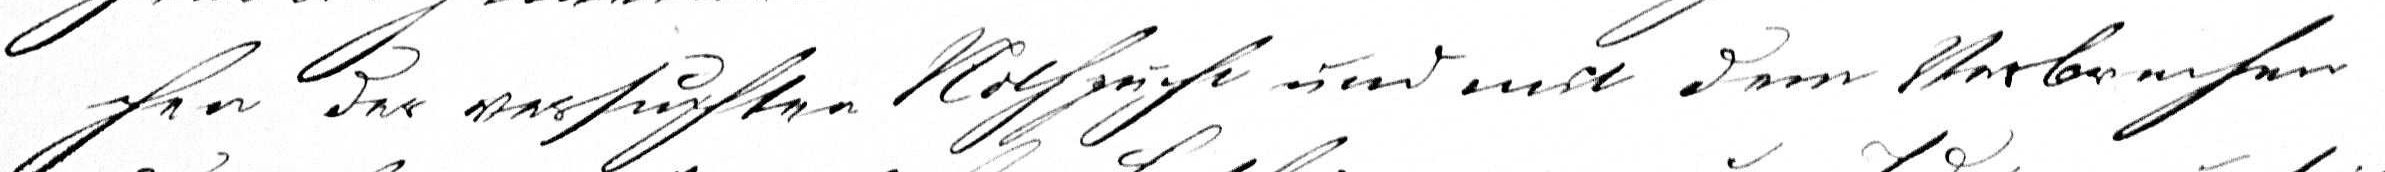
chen der versuchten Nothzucht und mit dem Verbrechen
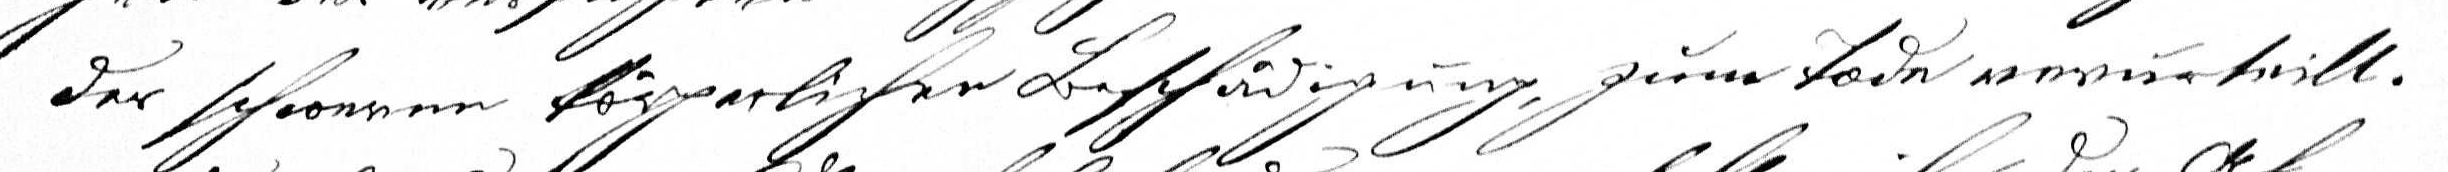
der schweren körperlichen Beschädigung, zum Tode verurteilt.
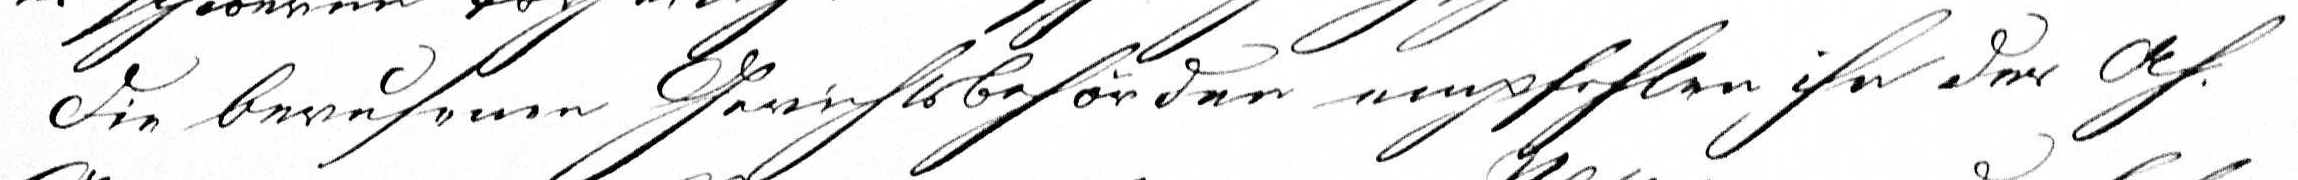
Die berufenen Gerichtsbehörden empfehlen ihn der Ah
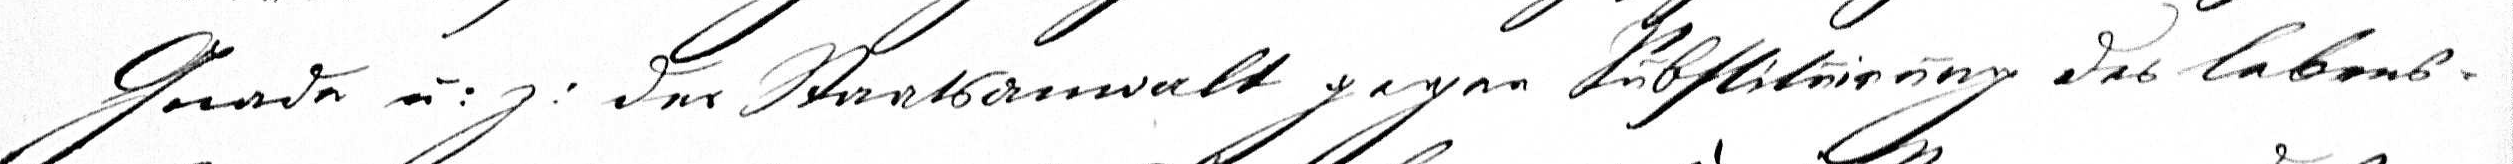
Gnade u. z. der Staatsanwalt gegen Substituirung des lebens¬
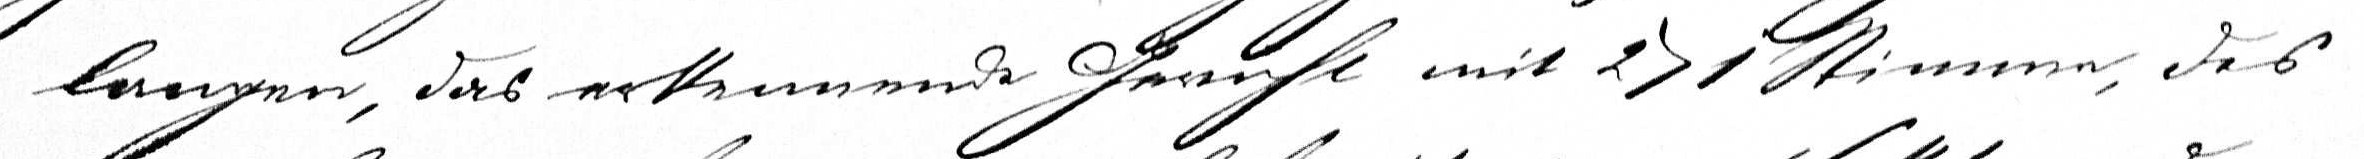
langen, das erkennende Gericht mit 2>1 Stimmen, des
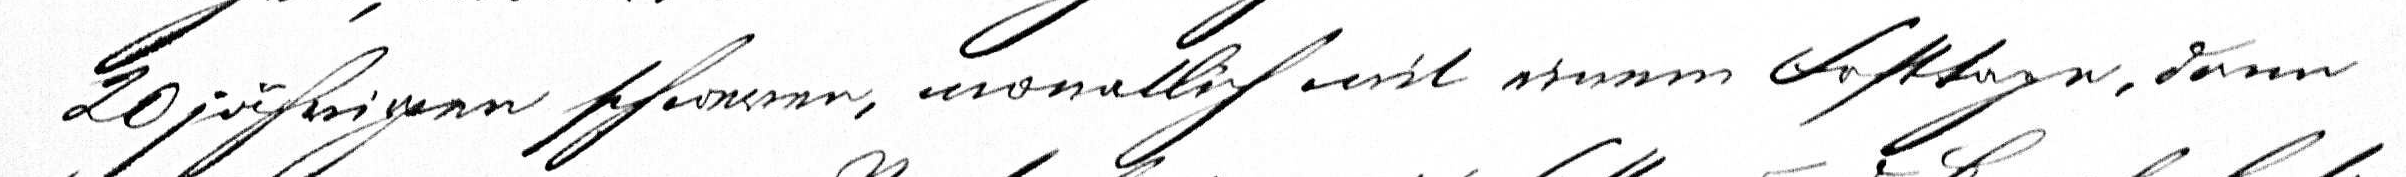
20jährigen schweren, monatlich mit einem Fasttage, dann
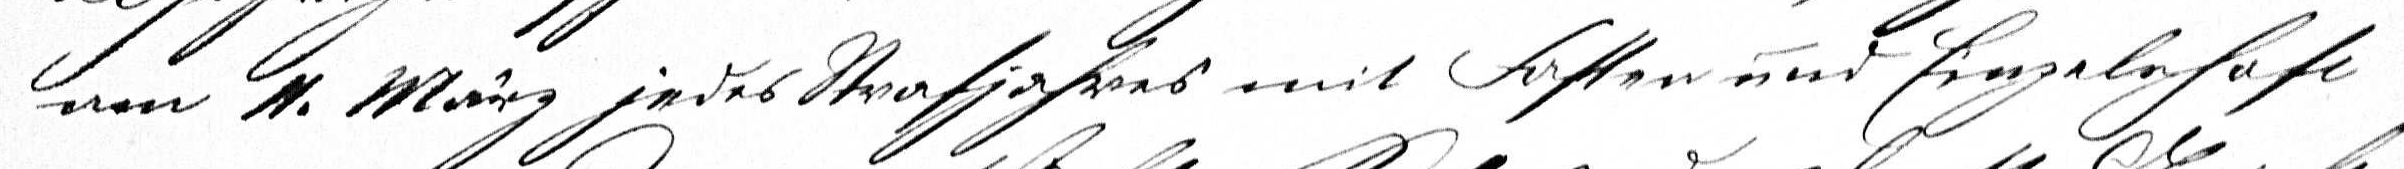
von 11. März jedes Strafjahres mit Fasten und Einzelnhaft
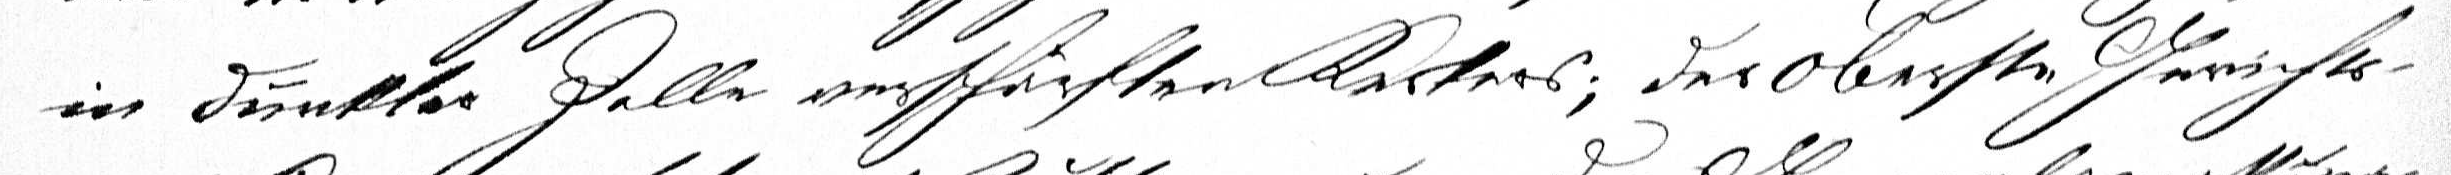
in dunkler Zelle verschärfte Kerkers; der Oberste Gerichts-
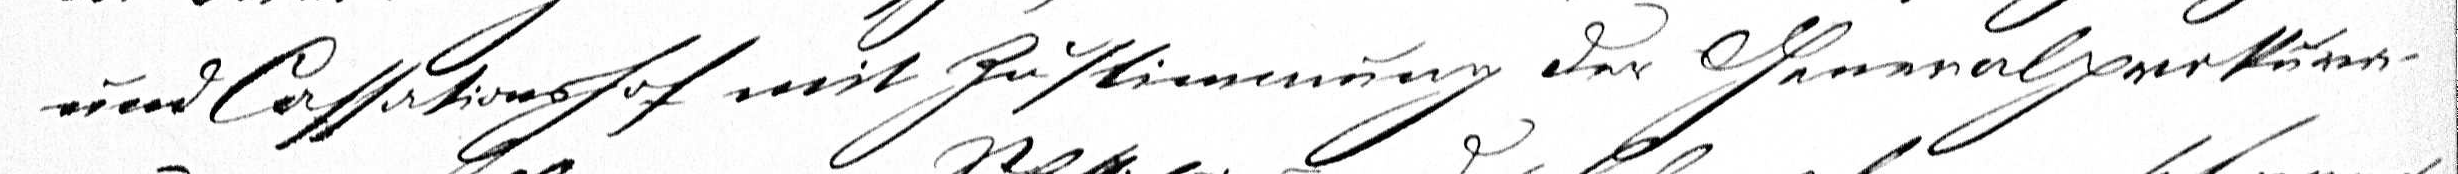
und Cassationshof mit Zustimmung der Generalprokura¬
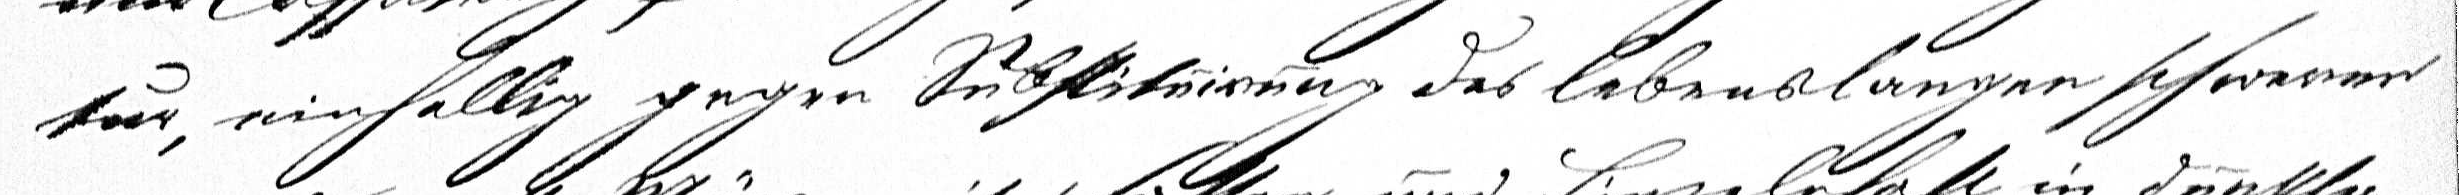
tur, einhellig gegen Substituirung des lebenslangen schweren
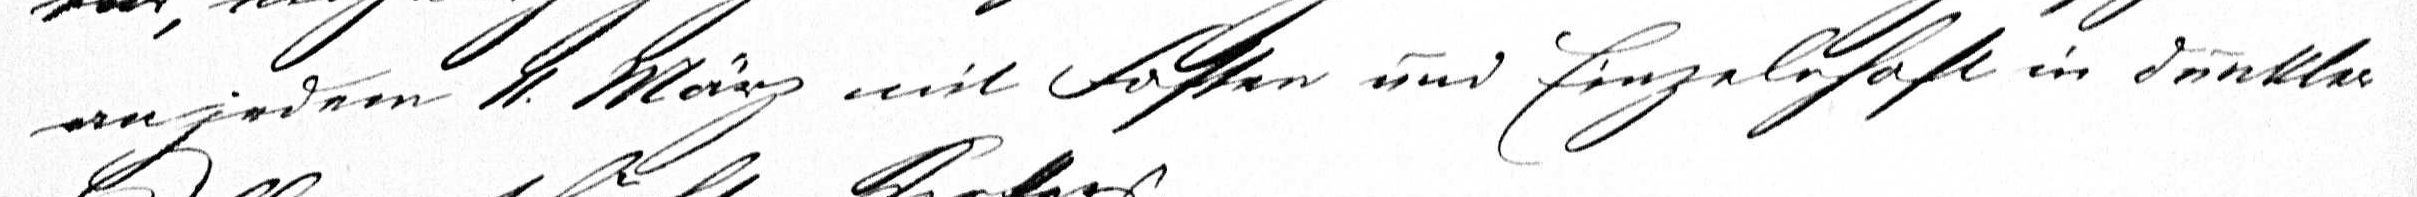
an jedem 11. März mit Fasten und Einzelnhaft in dunkler
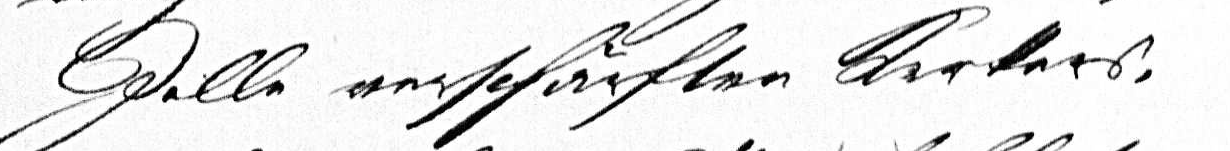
Zelle verschärften Kerkers.
